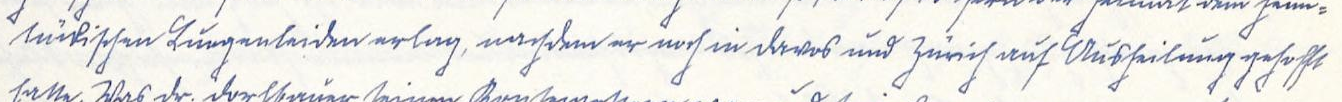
tückischen Lungenleiden erlag, nachdem er noch in Davos und Zürich auf Ausheilung gehofft
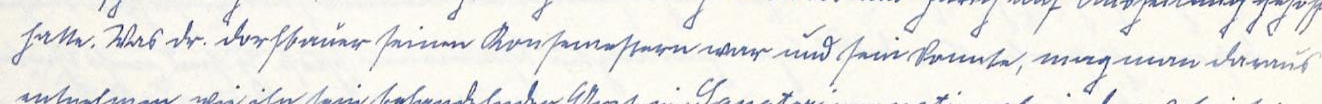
hatte. Was Dr. Dorfbauer seinen Konsemestern war und sein konnte, mag man daraus
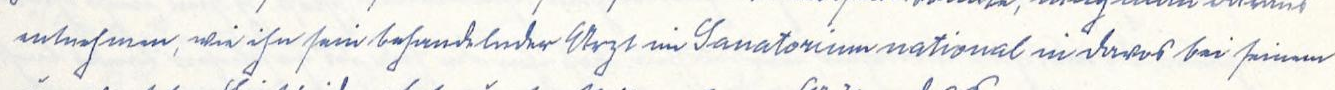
entnehmen, wie ihn sein behandelnder Arzt im Sanatorium national inDavos bei seinem
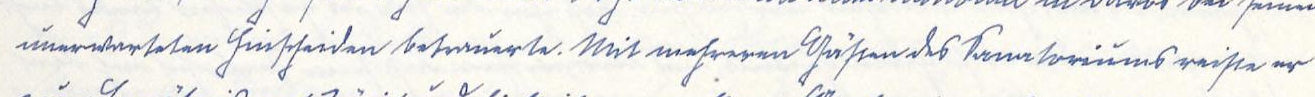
unerwarteten Hinscheiden betrauerte. Mit mehreren Gästen des Sanatoriums reiste er
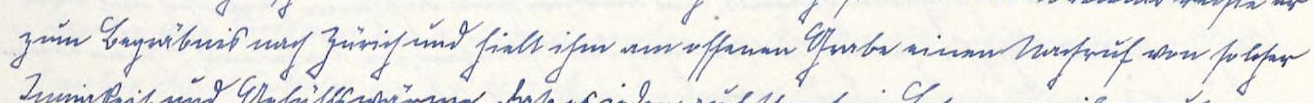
zum Begräbnis nach Zürich und hielt ihm am offenen Grabe einen Nachruf von solcher
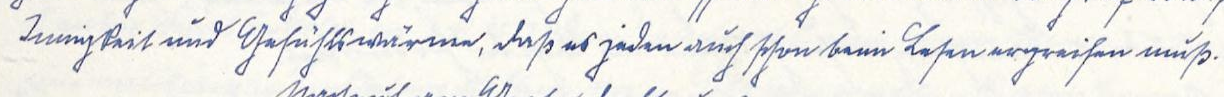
Innigkeit und Gefühlswärme, dass es jeden auch schon beim Lesen ergreifen muß.-
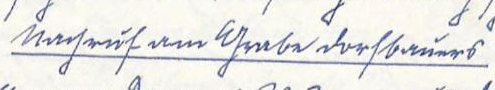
Nachruf am Grabe Dorfbauers
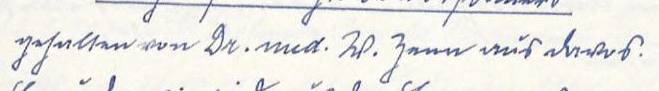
gehalten von Dr. med. Zenn aus Davos.
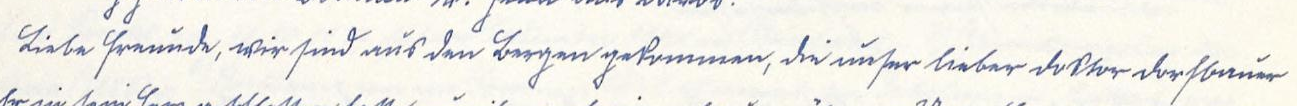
Liebe Freunde, wir sind aus den Bergen gekommen, die unser lieber Doktor Dorfbauer
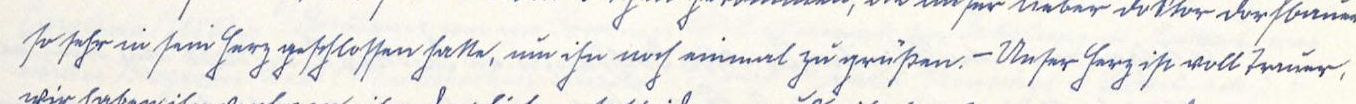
so sehr in sein Herz geschlossen hatte, um ihn noch einmal zu grüßen. - Unser Herz ist voll Trauer,
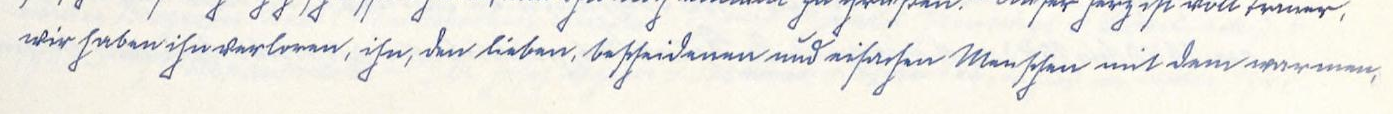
wir haben ihn verloren, ihn, den lieben, bescheidenen und einfachen Menschen mit dem warmen,
